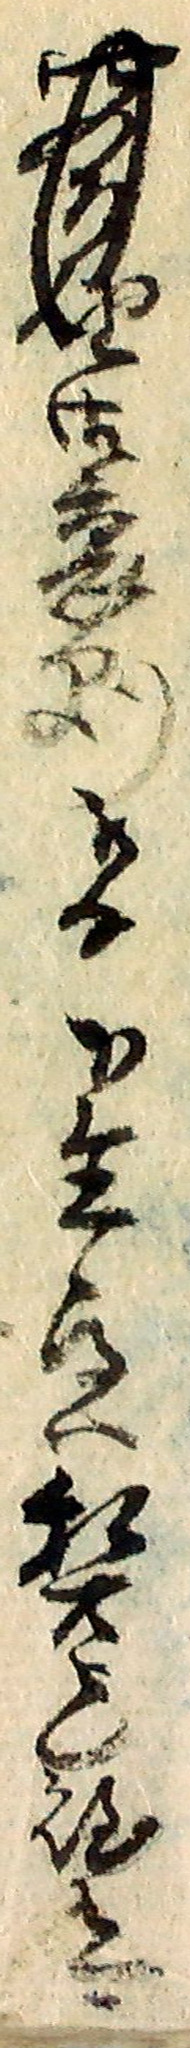聞召届」御裏判被為下置候得は私共迄難有
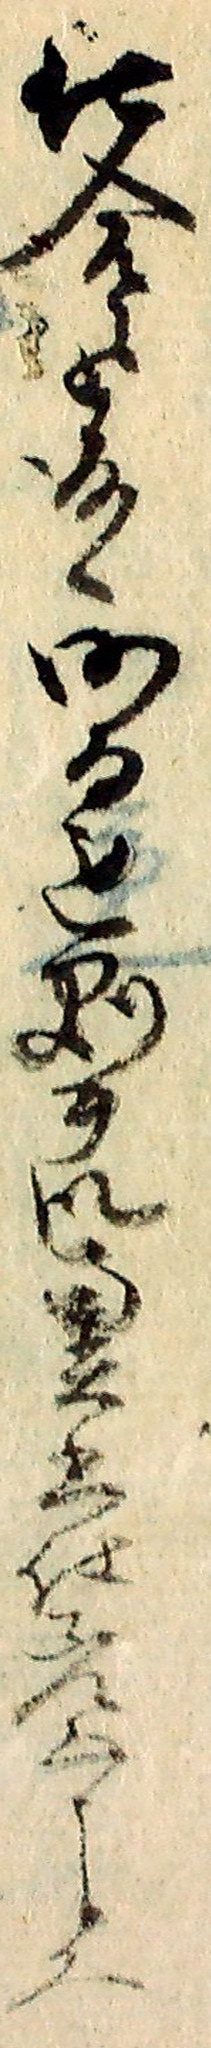仕合に奉存候仍て連判を以奥書仕差上申候以上
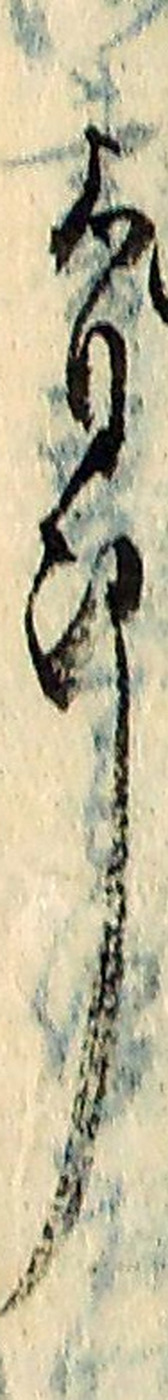右同断
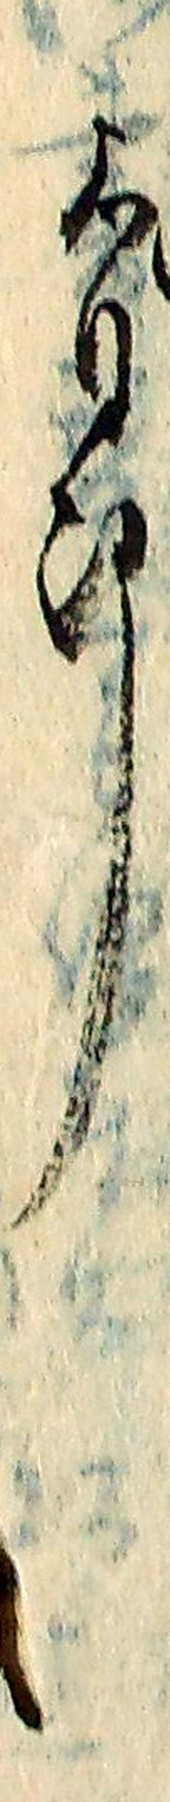右同断

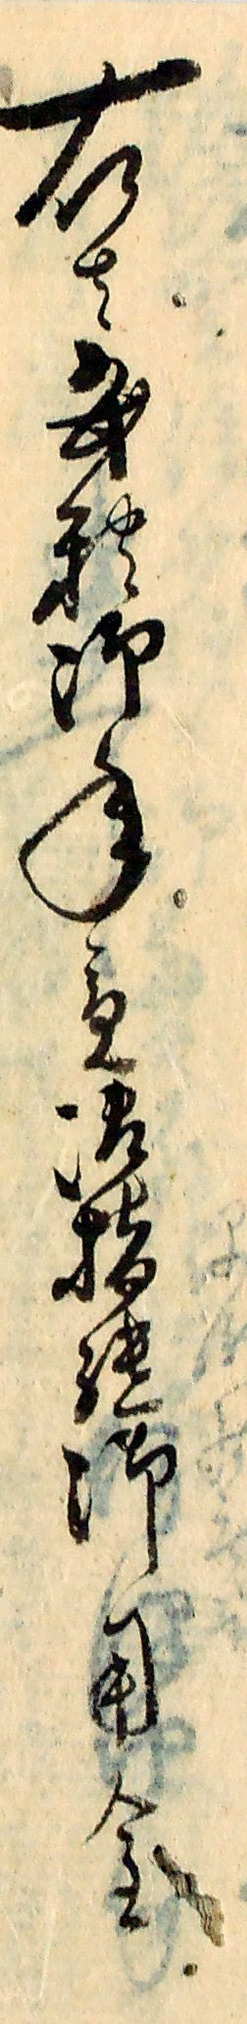右は当秋御年貢御指継御用金
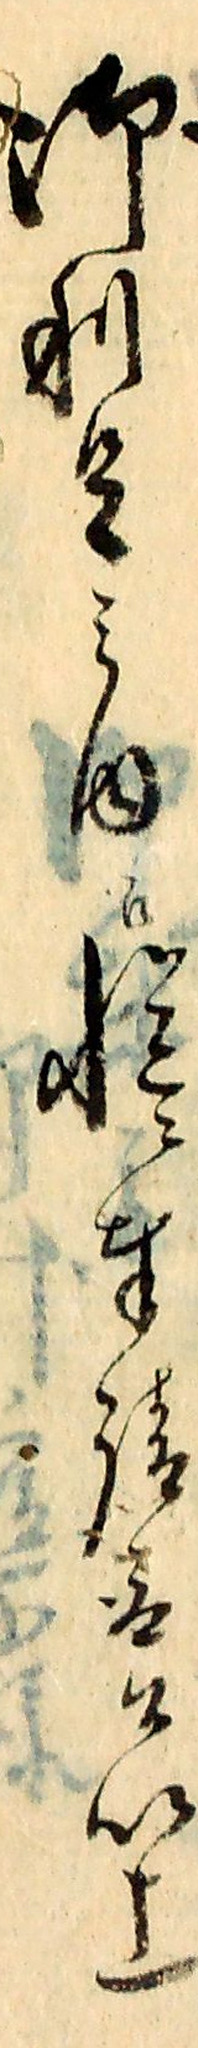御利足之内え慥に奉請取候以上
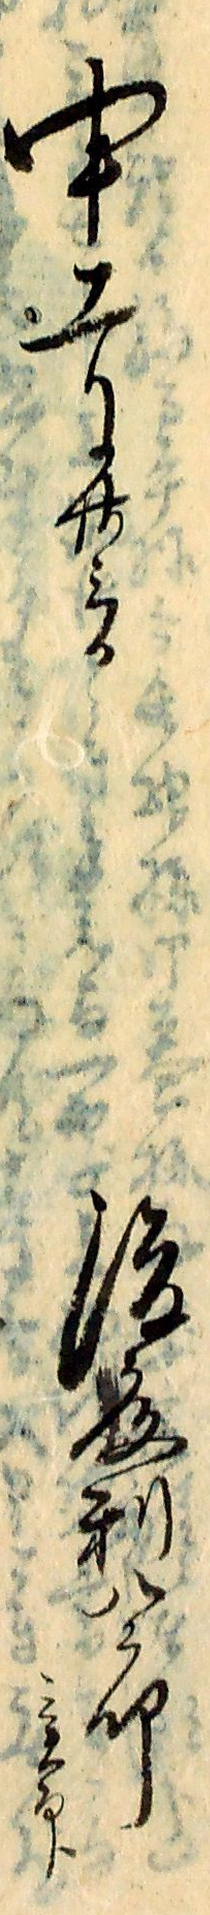申十一月廿三日後藤利八郎
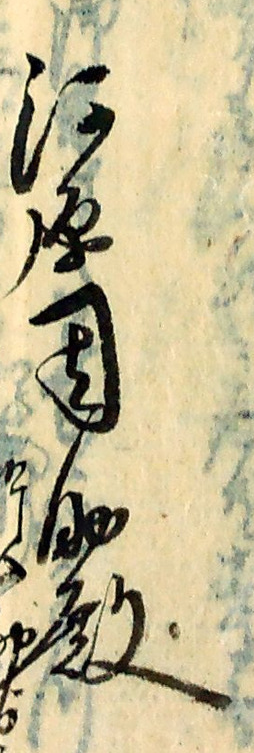河原周助殿
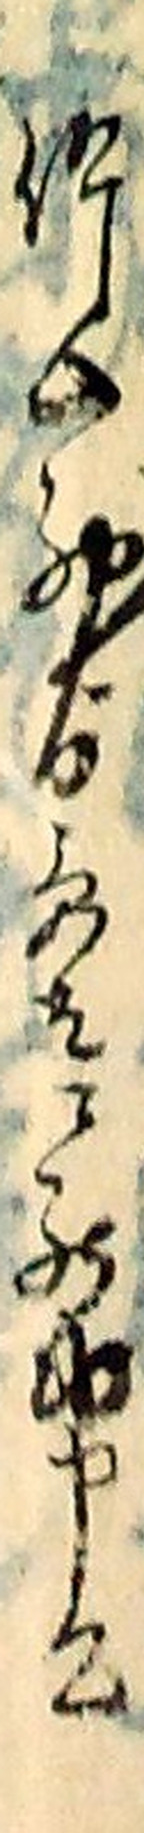但し厶初ゟ受取に罷出申候
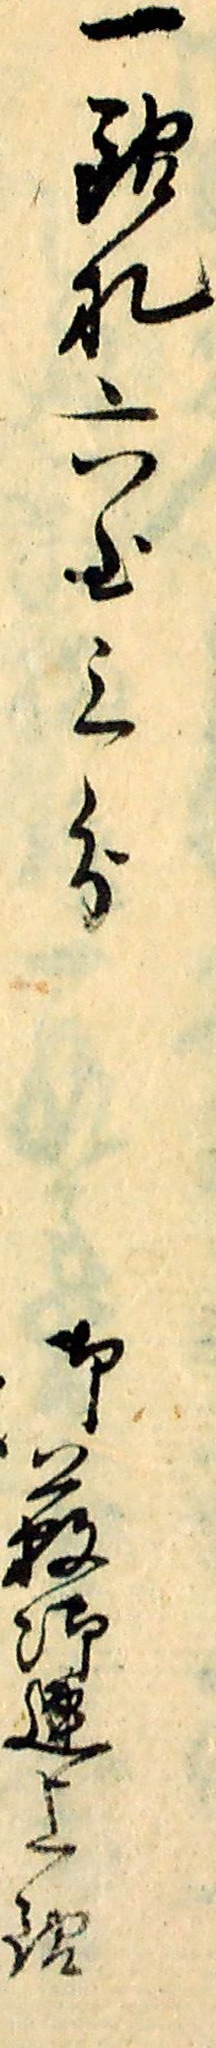一銀札六匁三分御藪御運上銀
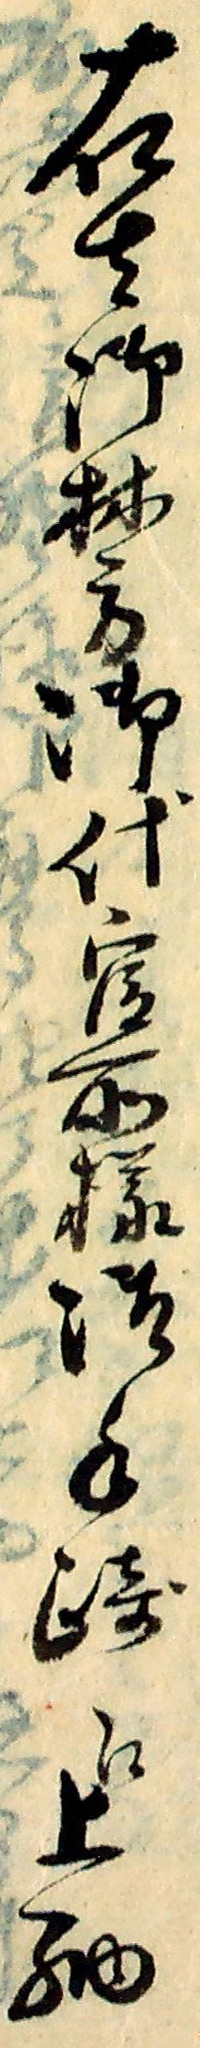右は御林方御代官所様御手崎え上納
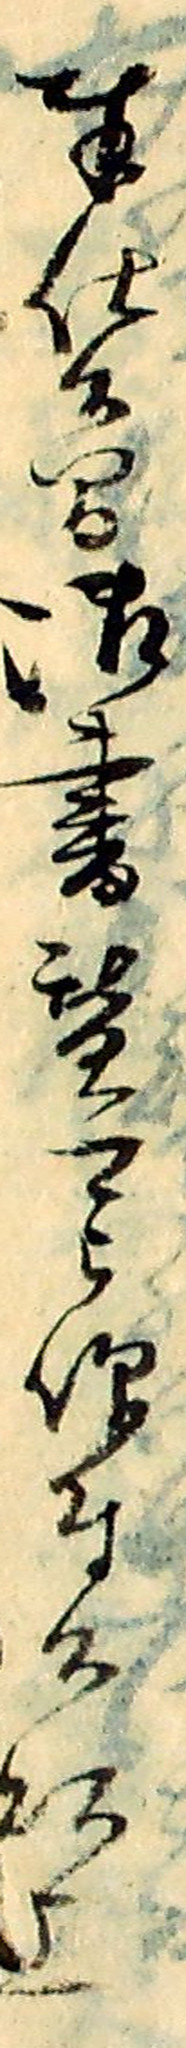奉仕候間御書替可被仰付候以上
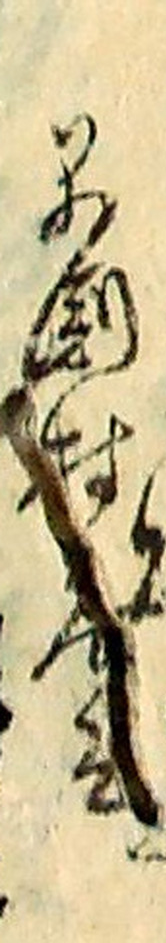早淵村庄屋
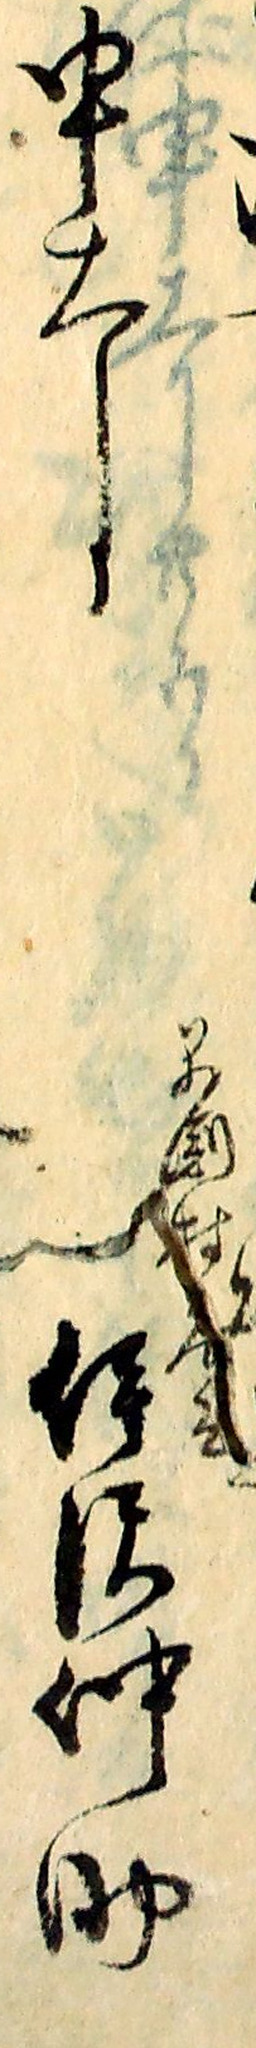申十一月伊沢仲助
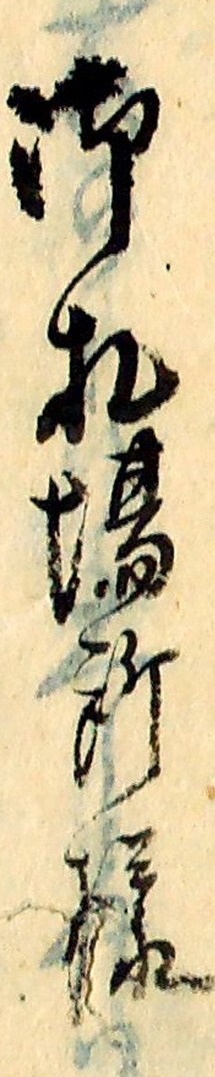御札場所様

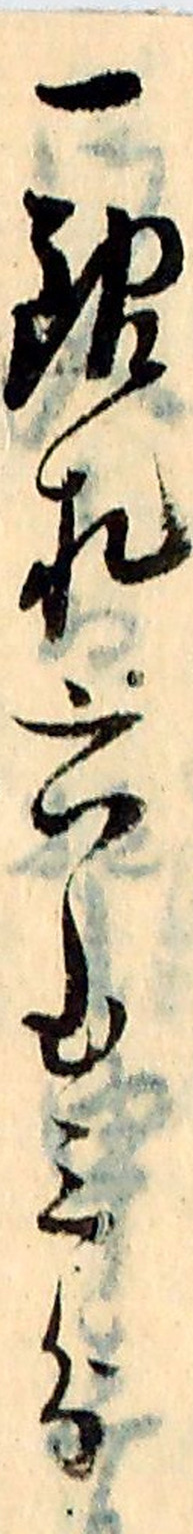一銀札六匁三分
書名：諸御願書控(後藤氏壱番）
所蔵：鳴門教育大学 Naruto University of Education
